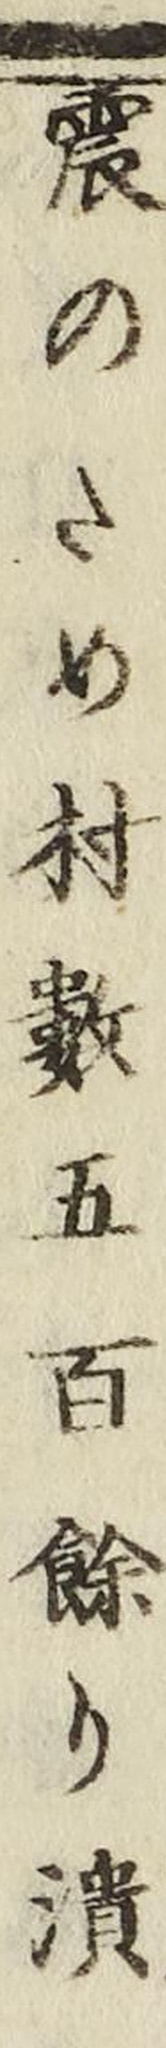震のため村数五百余り潰
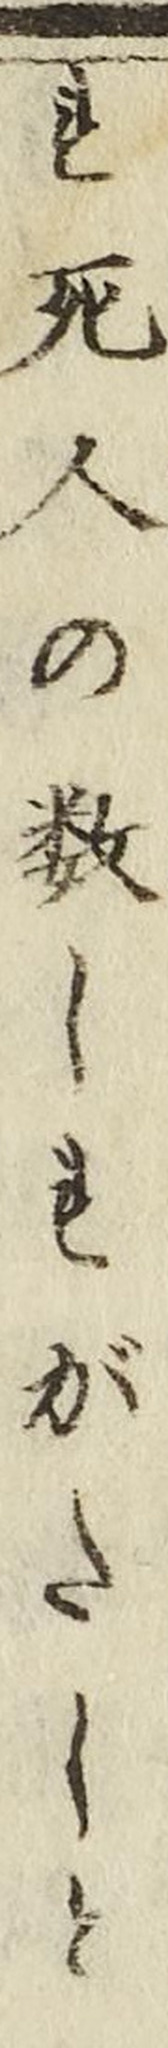れ死人の数しれがたしと
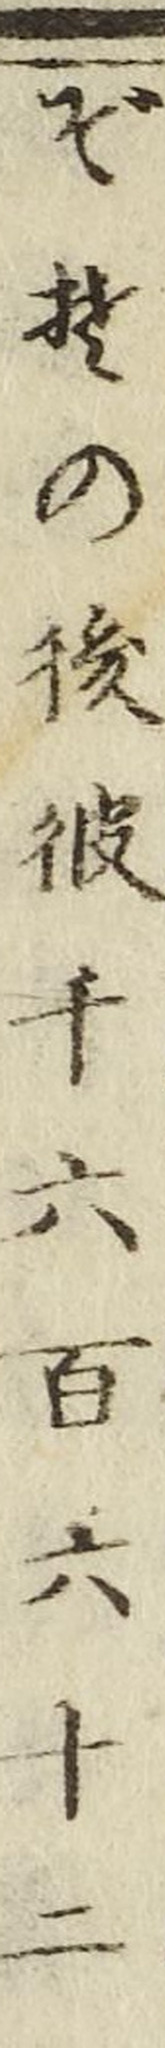ぞその後彼千六百六十二
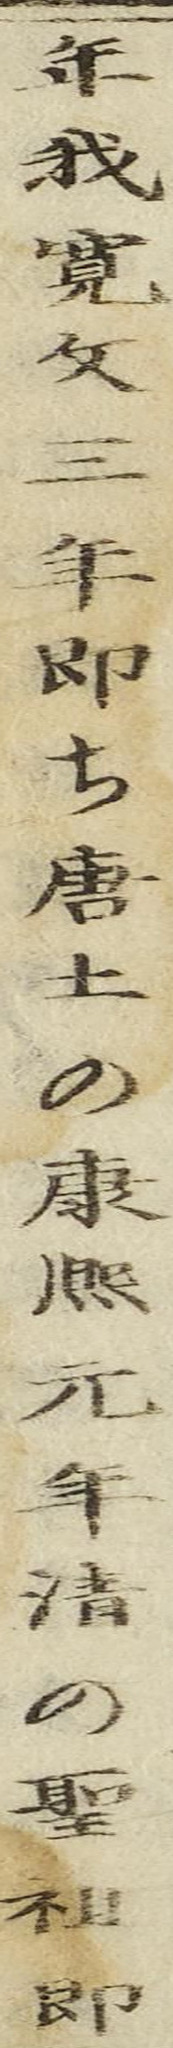年我寛文三年即ち唐土の康熙元年清の聖祖即

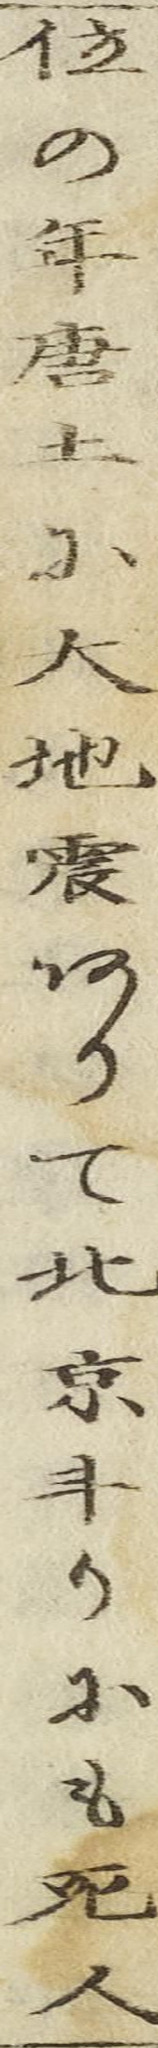位の年唐土に大地震ありて北京斗りにも死人
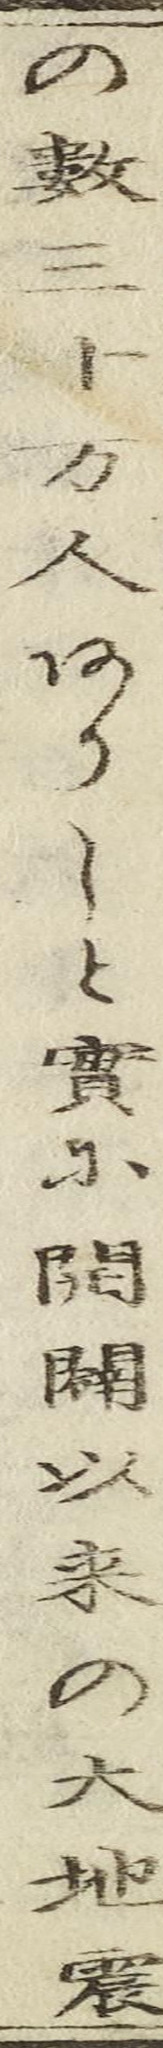の数三十万人ありしと実に開闢以来の大地震
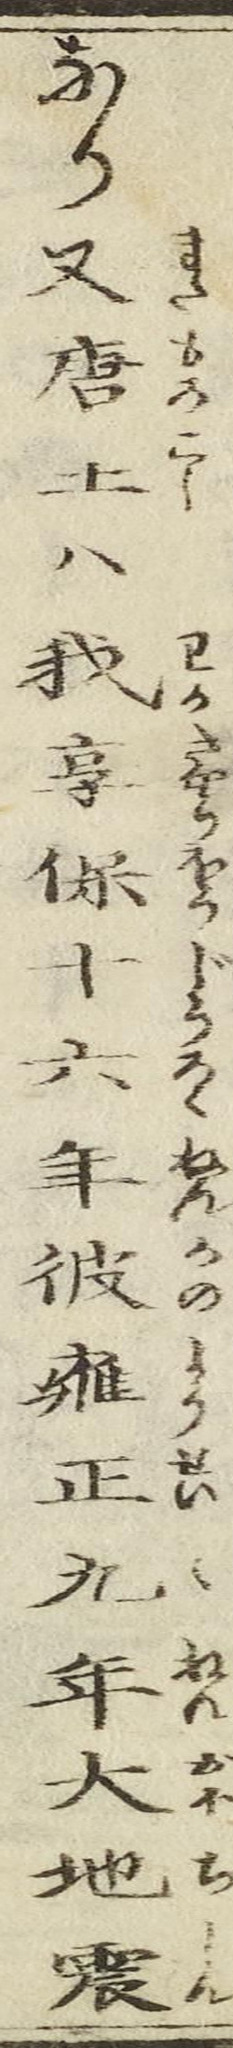なり又唐土は我享保十六年彼雍正九年大地震
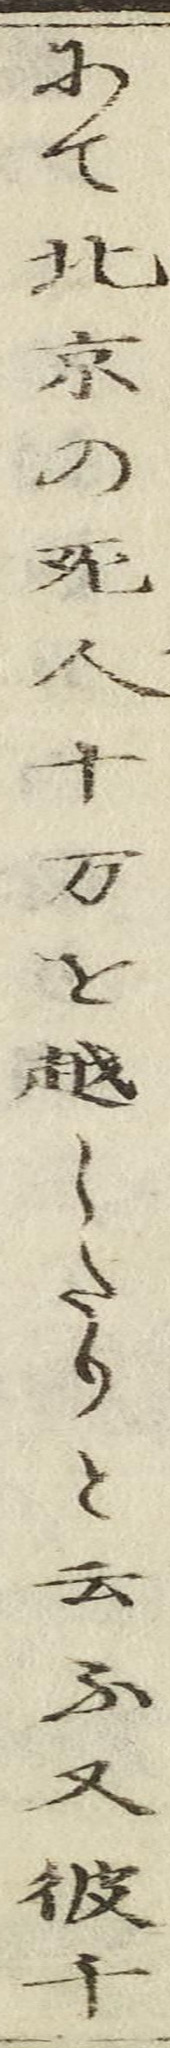にて北京の死人十万を越したりと云ふ又彼千
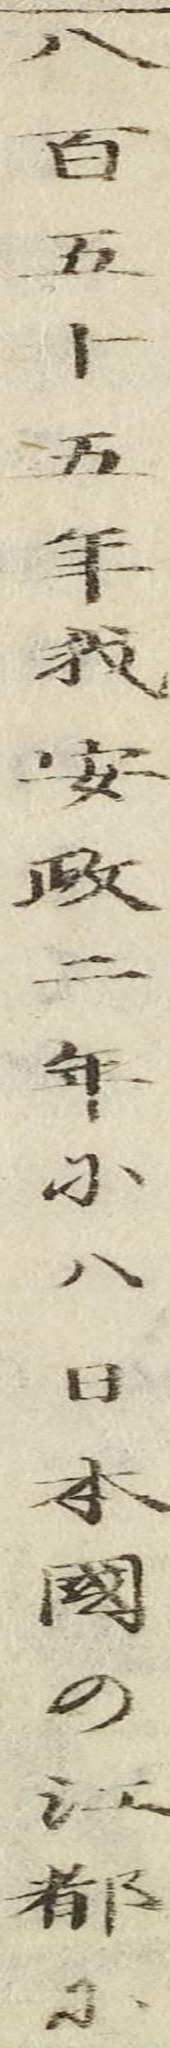八百五十五年我安政二年には日本国の江都に
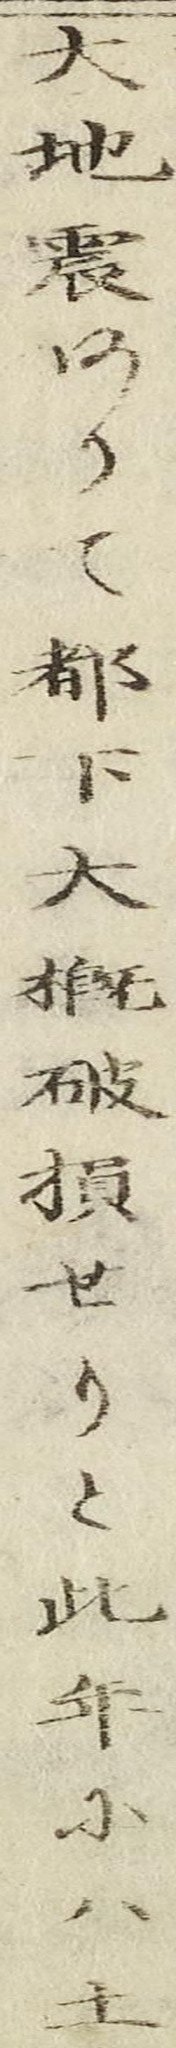大地震ありて都下大概破損せりと此年には土
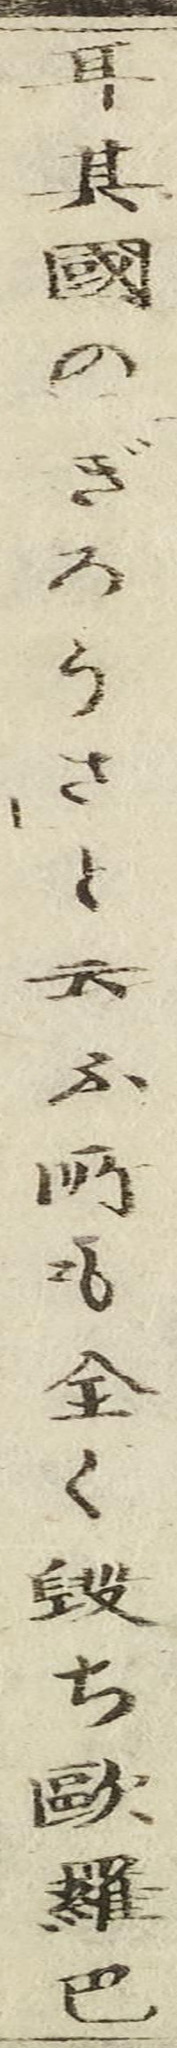耳其国の「ぎろうさ」と云ふ所も全く毀ち欧羅巴
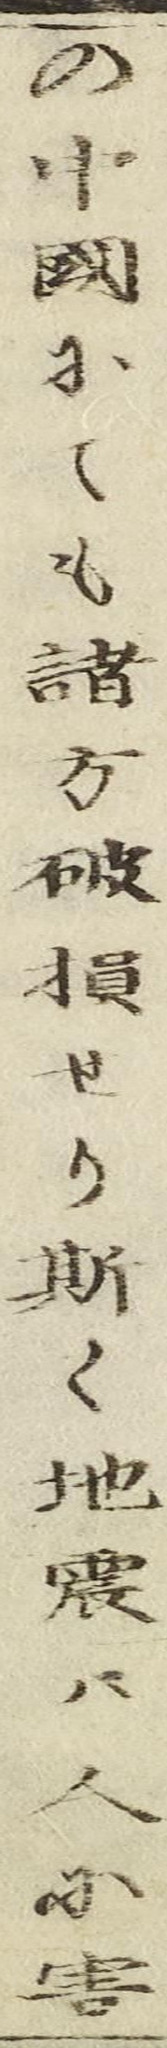の中国にても諸方破損せり斯く地震は人に害
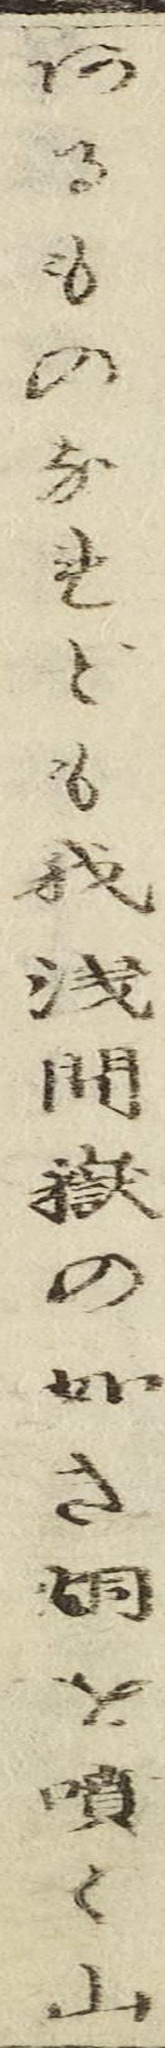あるものなれども我浅間嶽の如き煙を噴く山
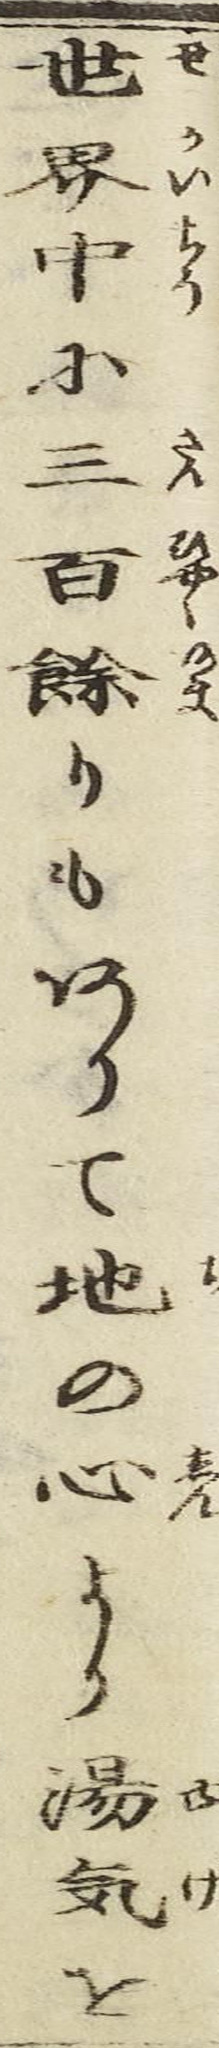世界中に三百余りもありて地の心より湯気を
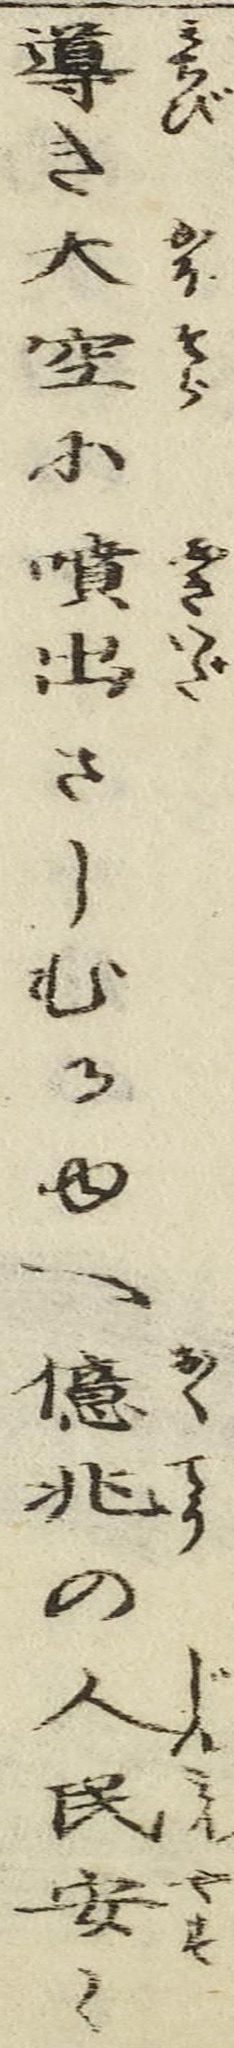導き大空に噴出さしむるゆへ億兆の人民安く
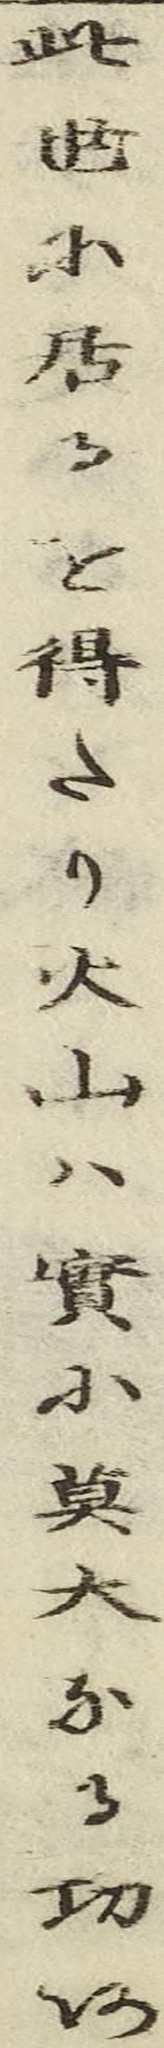此世に居るを得たり火山は実に莫大なる功あ
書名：天変地異
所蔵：東京大学地震研究所図書室 Earthquake Research Institute Library, The University of Tokyo, JAPAN
